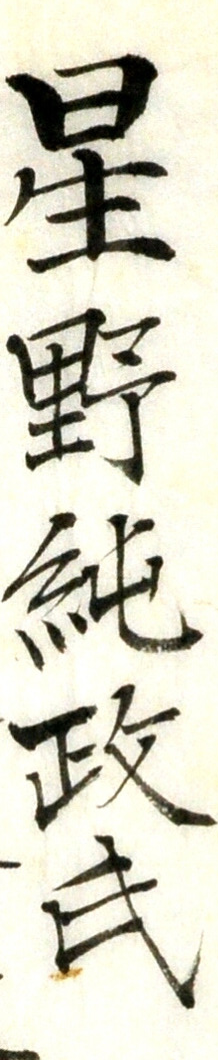星野純政氏
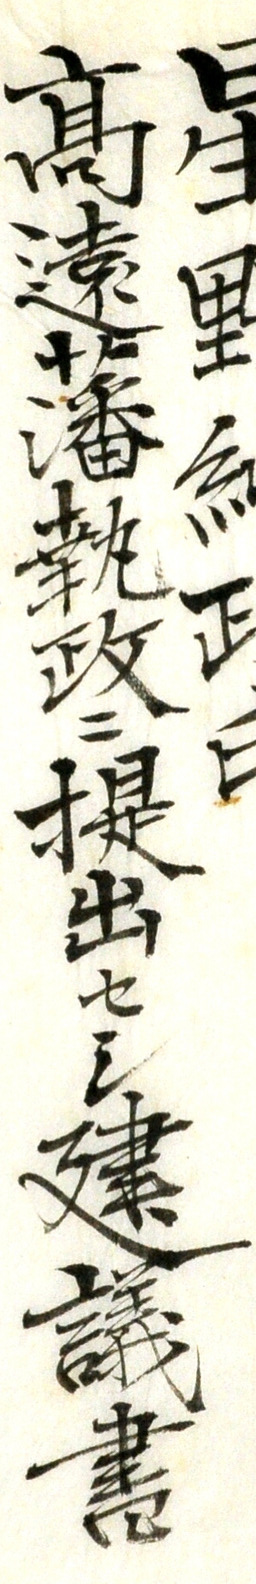高遠藩執政ニ提出セシ建議書

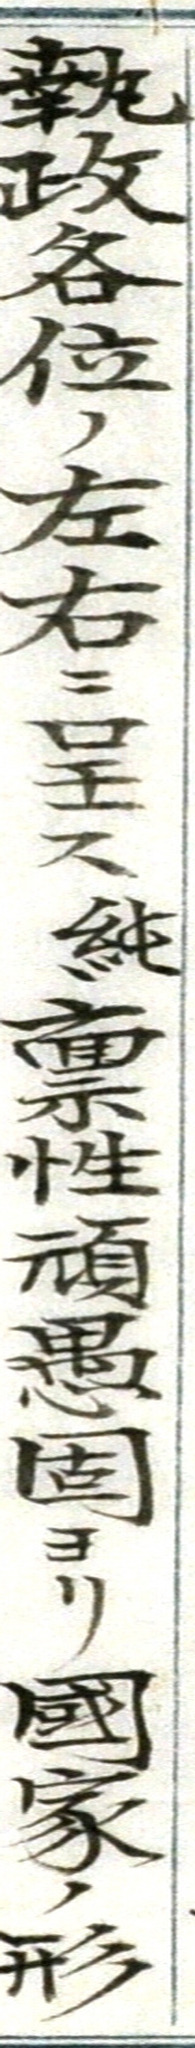執政各位ノ左右ニ呈ス純稟性頑愚固ヨリ国家ノ形
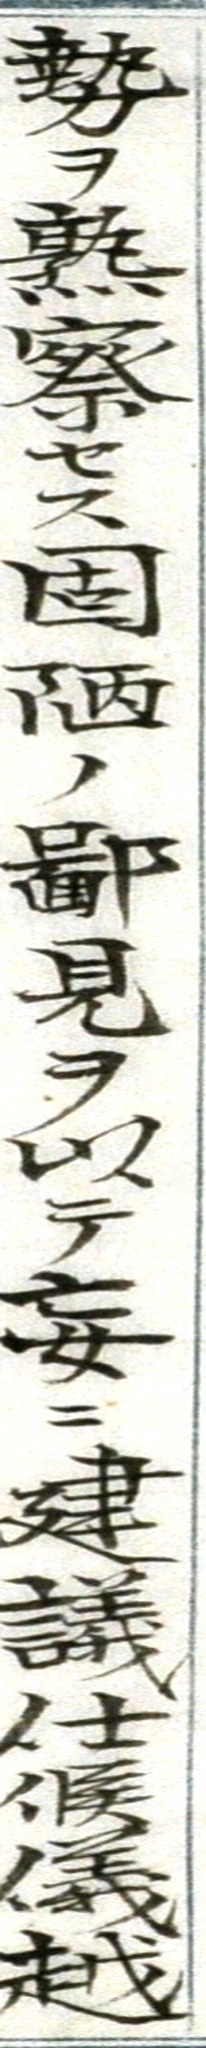勢ヲ熟察セス固陋ノ鄙見ヲ以テ妄ニ建議仕候儀越
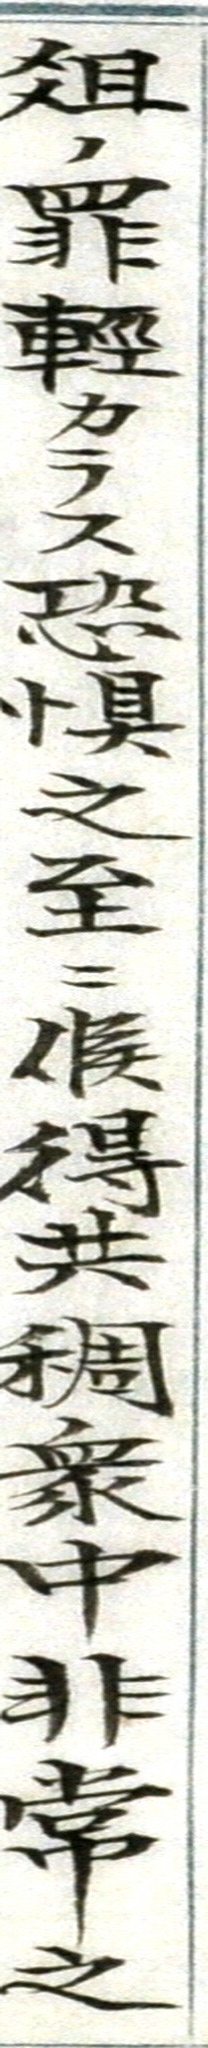俎ノ罪軽カラス恐惧之至ニ候得共椆衆中非常之
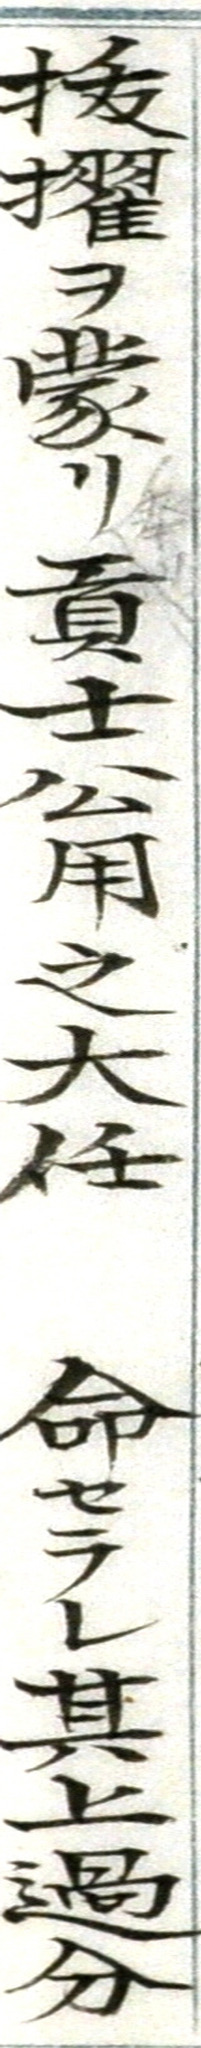抜擢ヲ蒙リ貢士公用之大任命セラレ其上過分
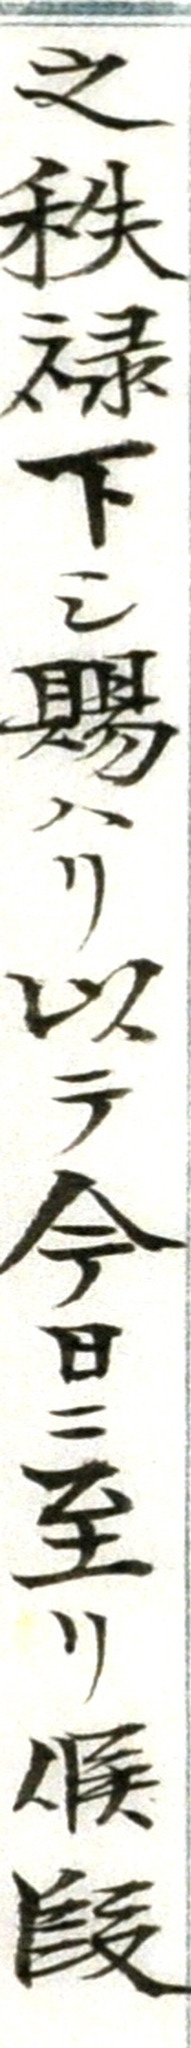之秩禄下シ賜ハリ以テ今日ニ至リ候段
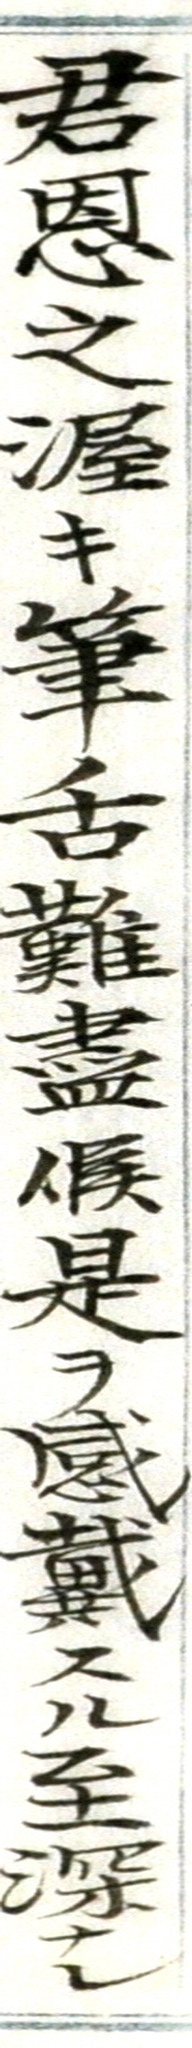君恩之渥キ筆舌難尽候是ヲ感載スル至深ナシ
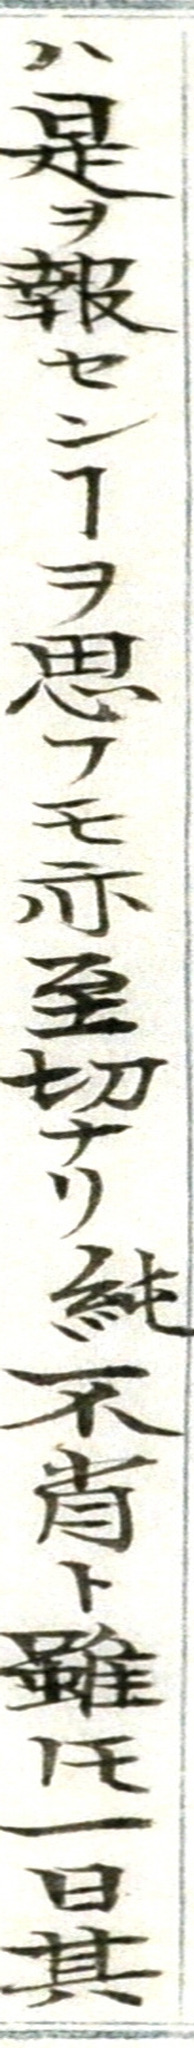ハ是ヲ報セン事ヲ思フモ亦至切ナシ純不肖ト雖トモ一日其
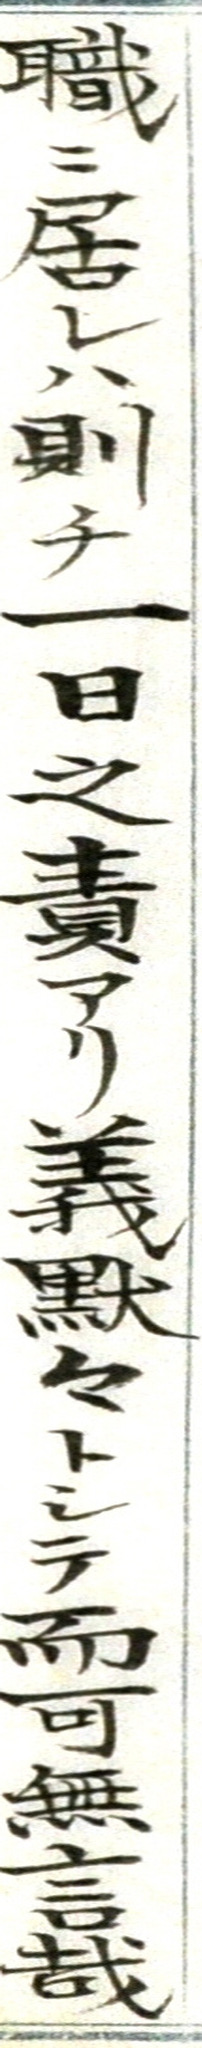職ニ居レハ則チ一日之責アリ義黙々トシテ而可無言哉
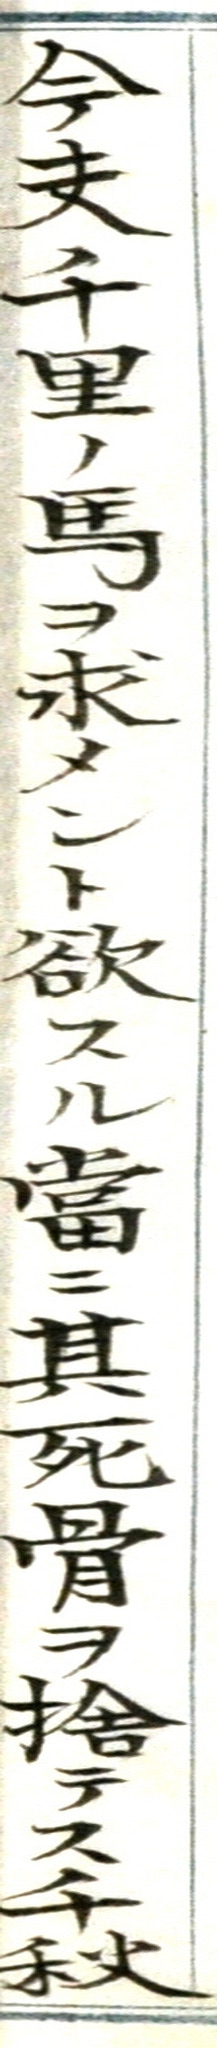今夫千里ノ馬ヲ求メント欲スル当ニ其死骨ヲ捨テス千秋

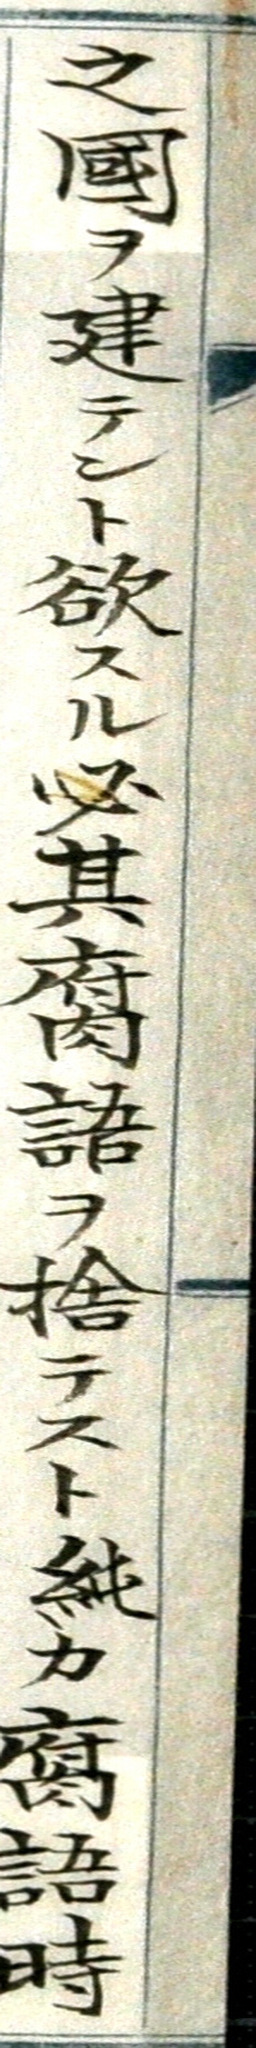之国ヲ建テント欲スル必其腐語ヲ捨テスト純カ腐語時
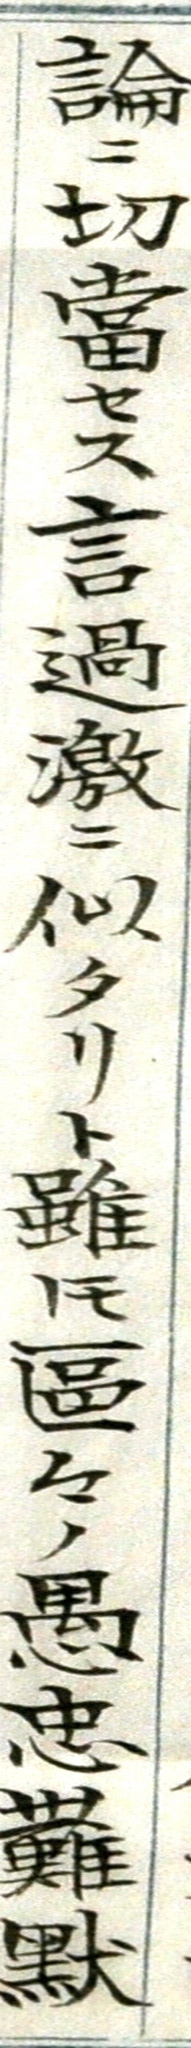論ニ切当セス言過激ニ似タリト雖トモ区々ノ愚忠難黙
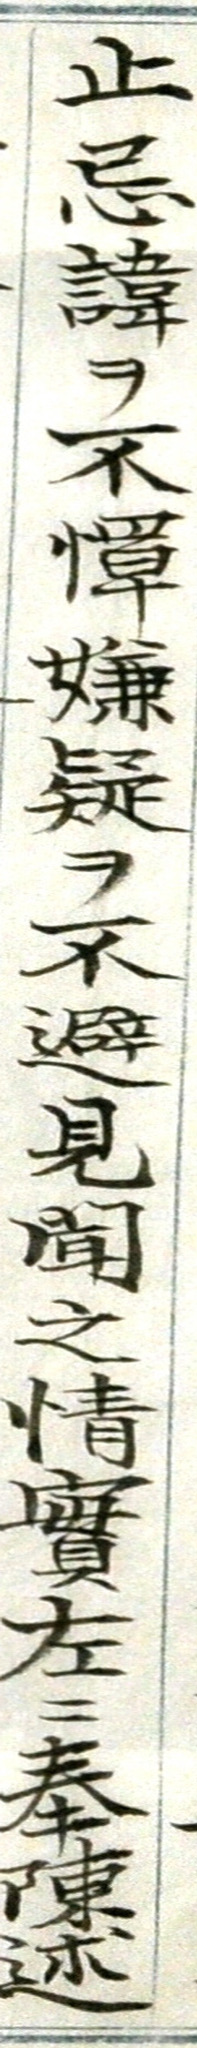止忌諱ヲ不憚嫌疑ヲ不避見聞之情実左ニ奉陳述
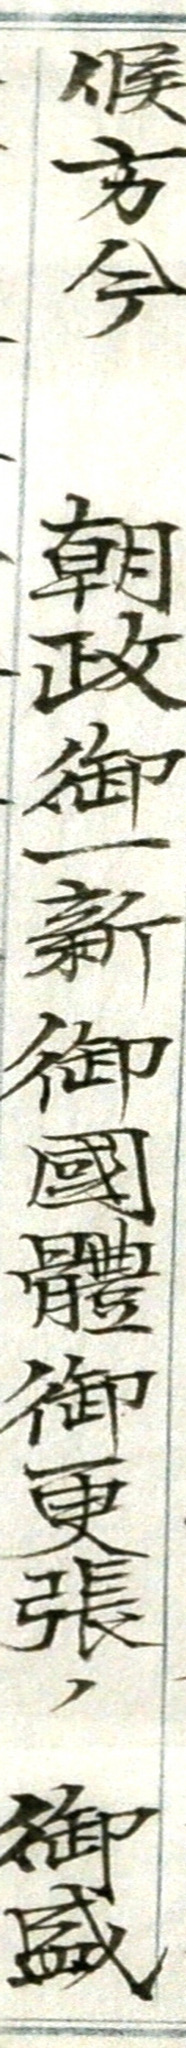候方今朝政御一新御国体御更張ノ御盛
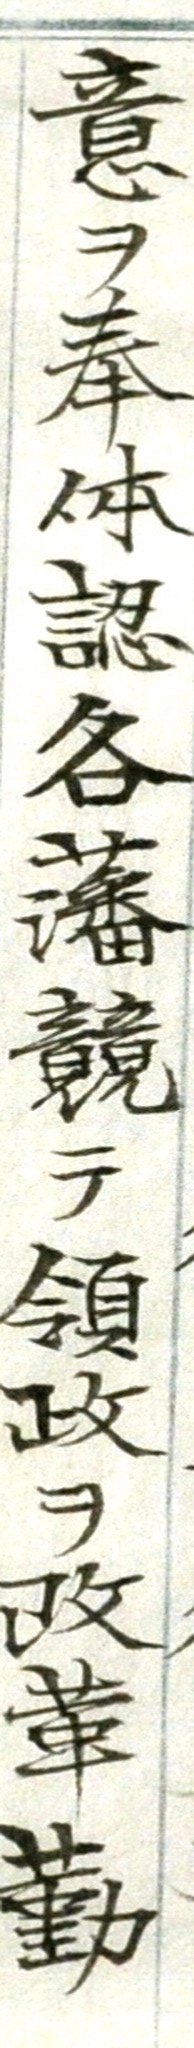意ヲ奉体認各藩競テ領政ヲ改革勤
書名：高遠藩執政ニ提出セシ建議書
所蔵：伊那市立高遠町図書館・合同会社AMANE
